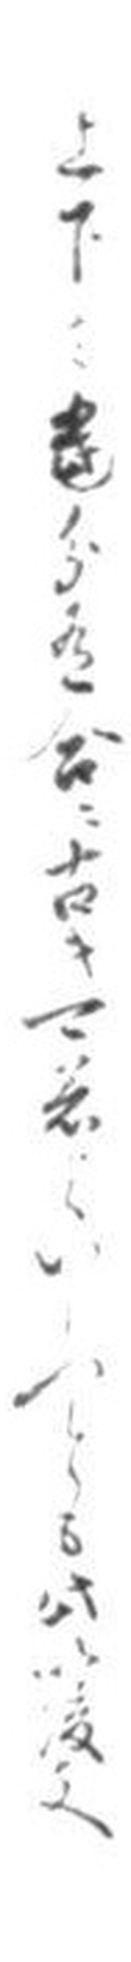上下者当分有合ニ古キ可着といふとも此以後支
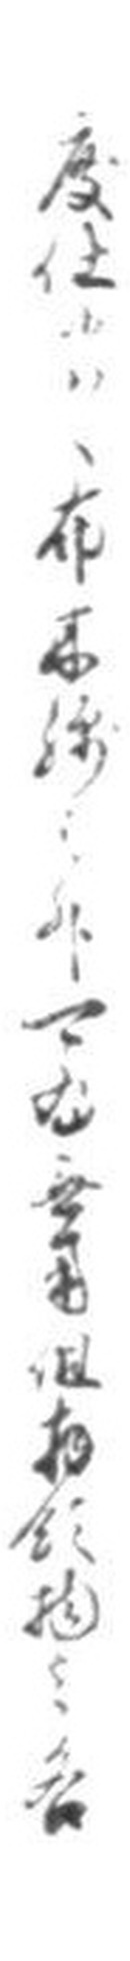度仕候ハヽ布木綿之外可為無用但拝領物者各
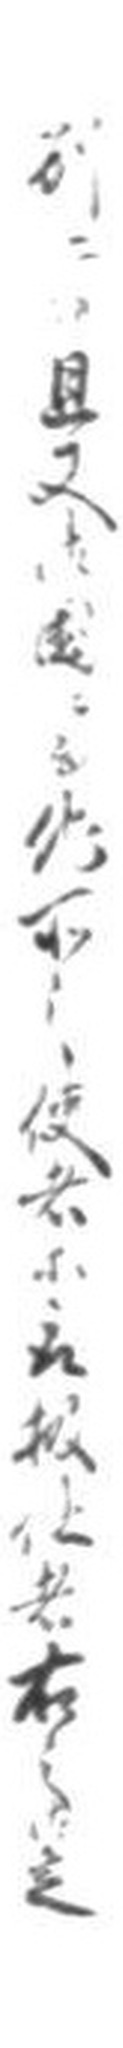別ニ候且又御国ニ而他所之使者等取扱仕者右之定
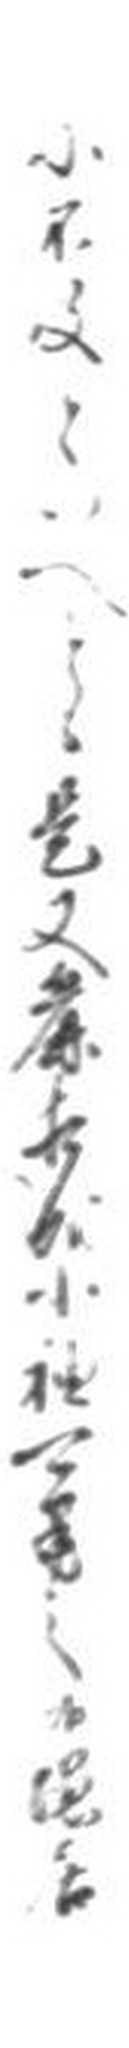に不及といへとも是又麁相成小袖可用之候隠居
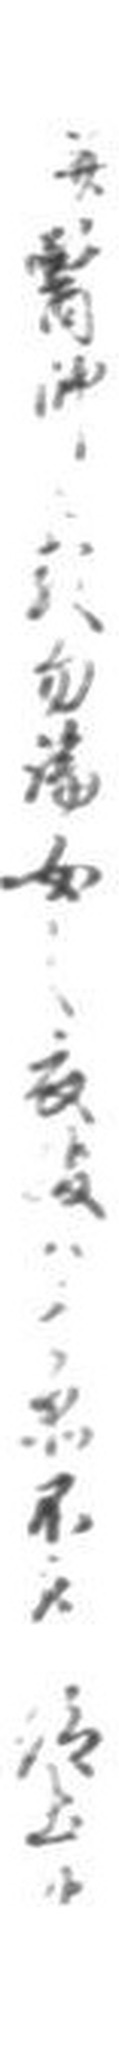并医師之類勿論女之衣服ハ其品不被仰出候
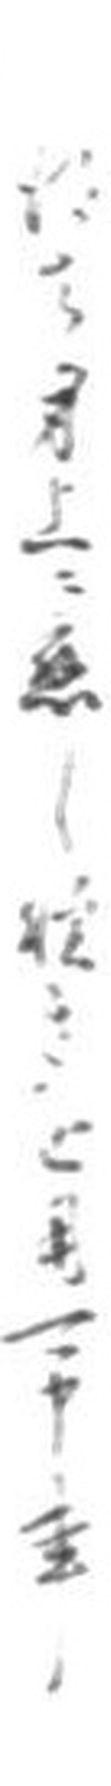得者身上ニ応し軽きを用可申事
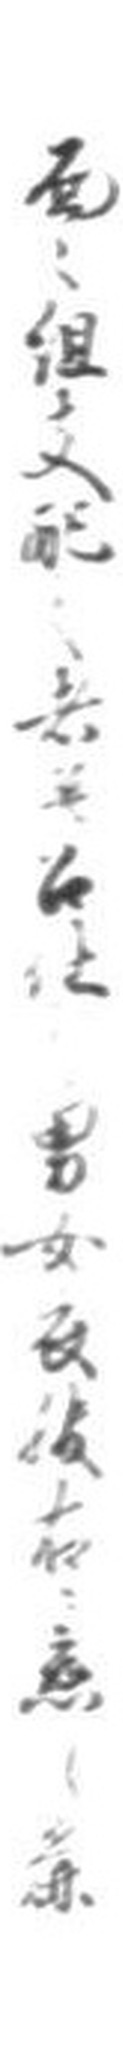面々組支配之者并召仕之男女衣服右ニ応し麁
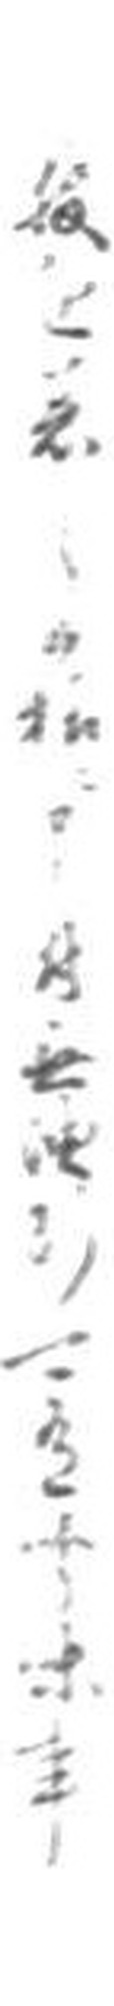服を着し候様ニ申付無油断可有吟味事
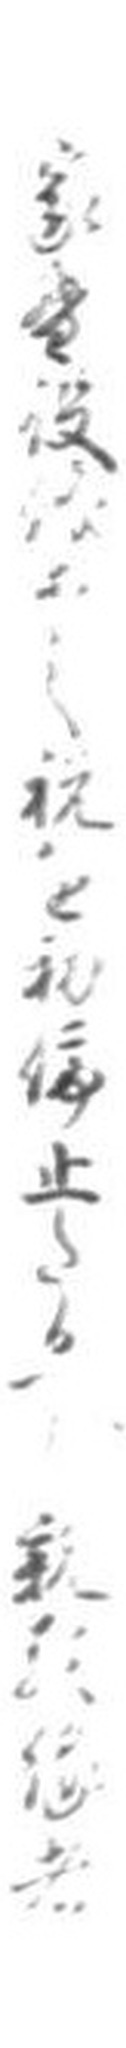家督役儀等之祝を初停止たるへし親類縁者
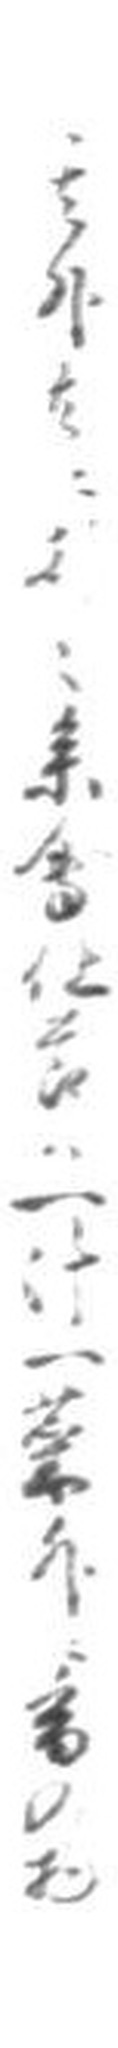其外共ニ折々参会仕節ハ一汁一菜外ニ香の物
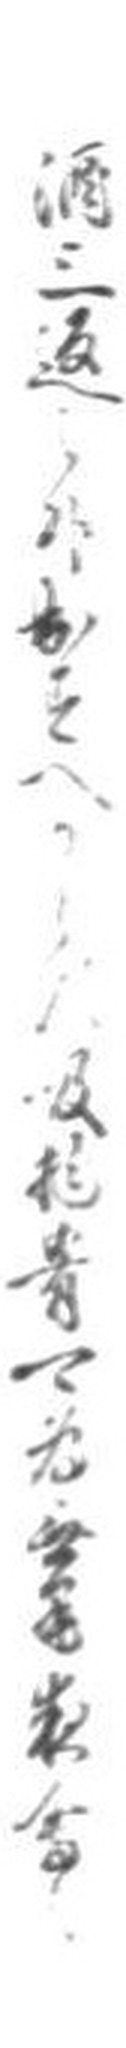酒三返之外出すへからす吸物肴可為無用夜会之

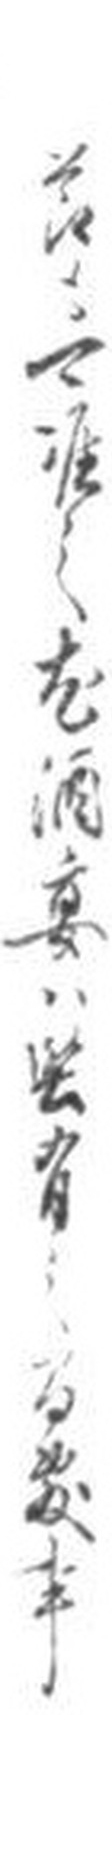節も可准之尤酒宴ハ堅有之間敷事
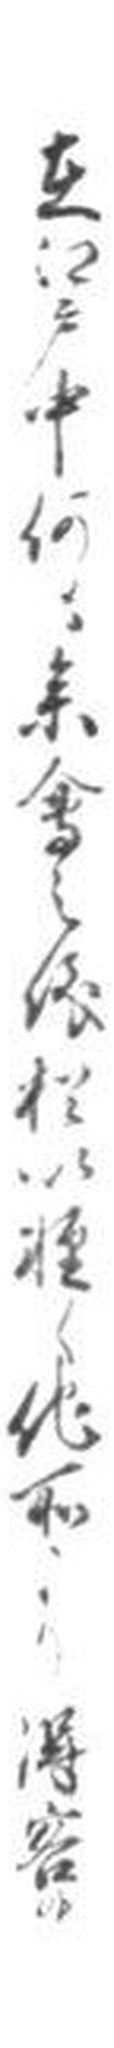在江戸中何も参会之儀猶以軽く他所より得客候
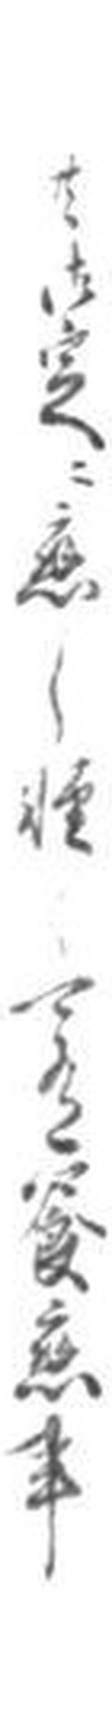共御定ニ応し軽く可有饗応事
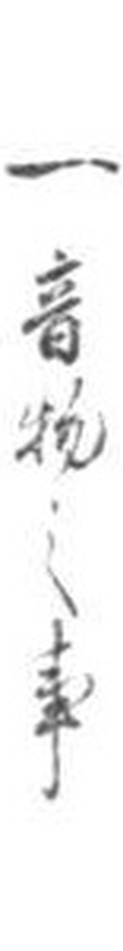一音物之事
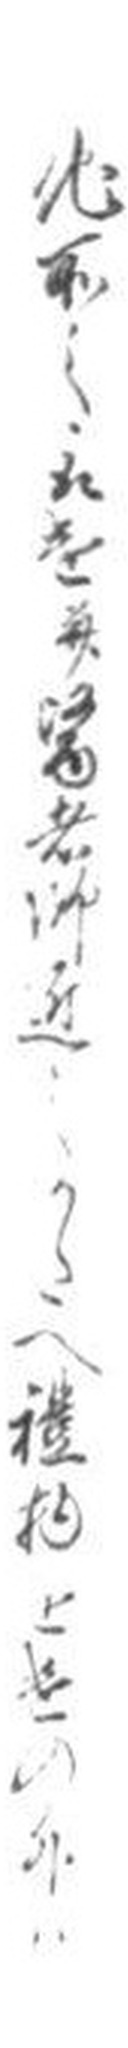他所之取遣并医者師匠のかたへ礼物を遣の外ハ
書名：家譜 三十八 宗矩公 従享保九年五月到享保九年十二月
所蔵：福井県文書館 Fukui Prefectural Archives
